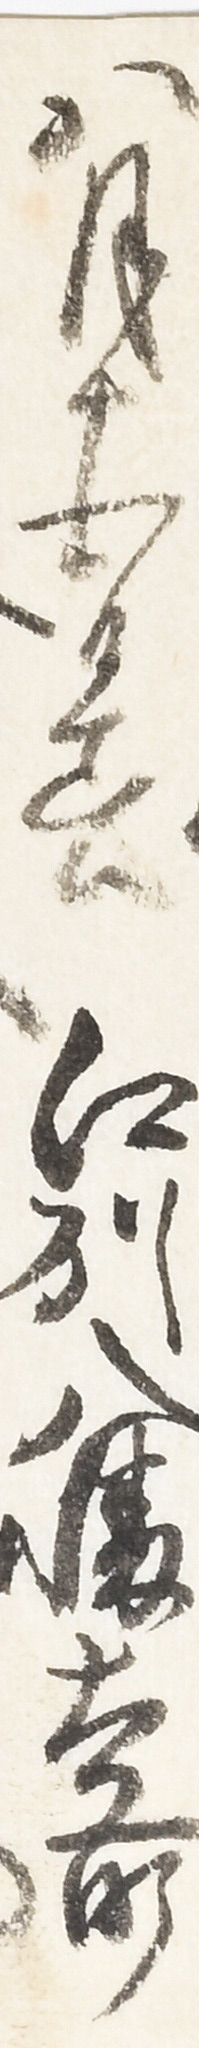八月十五日着江州八幡大工町
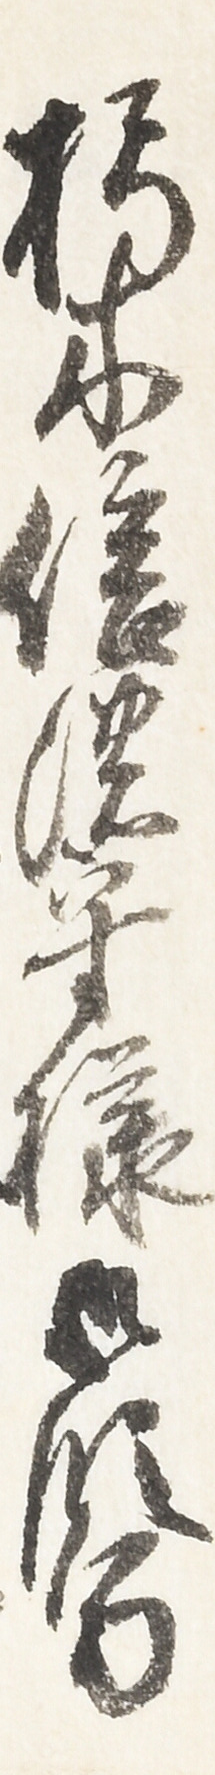朽木信濃守様御領分
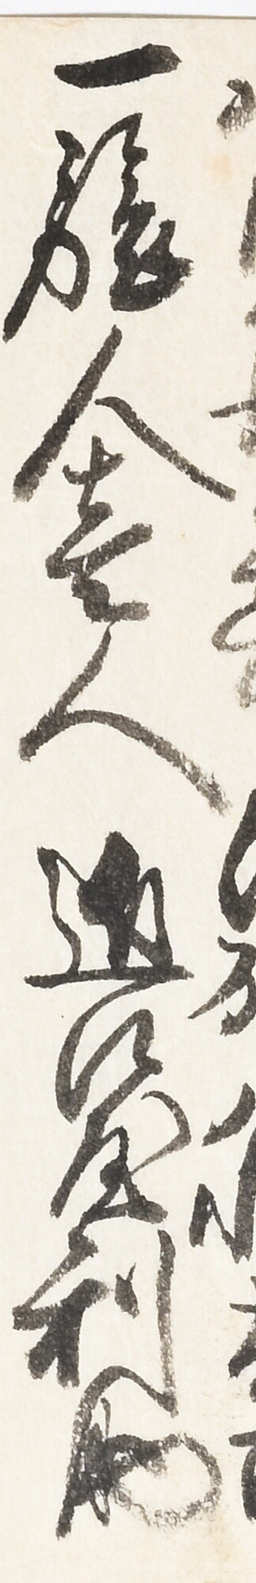一旅人壱人近江屋利助
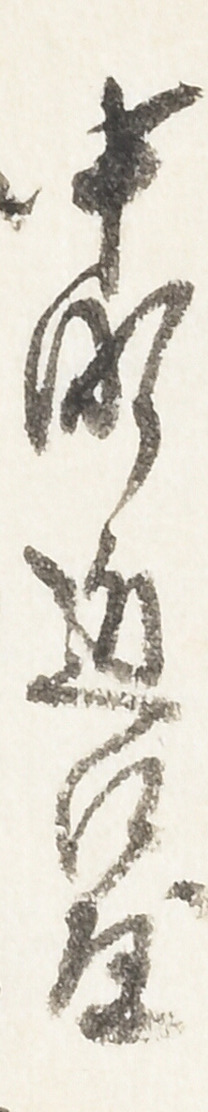中町近江屋
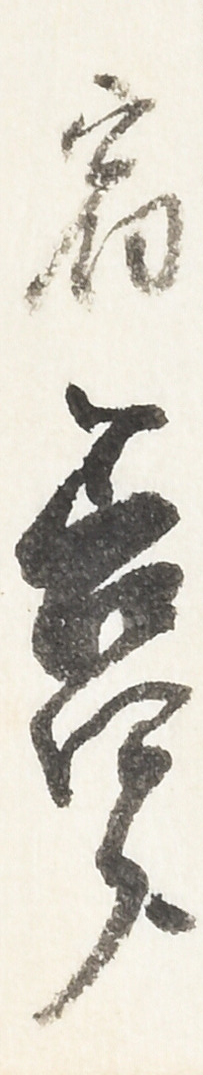宿善四郎
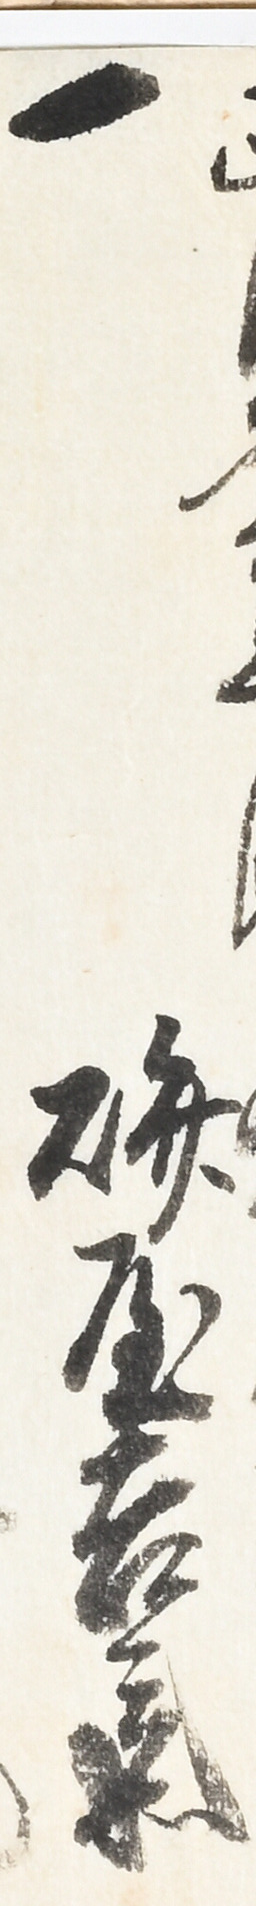一研屋吉兵衛
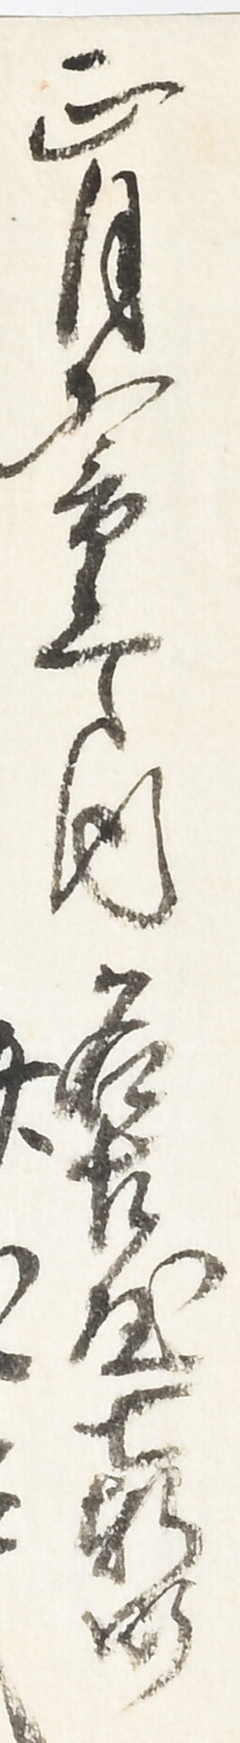正月書上之内名古屋七軒町
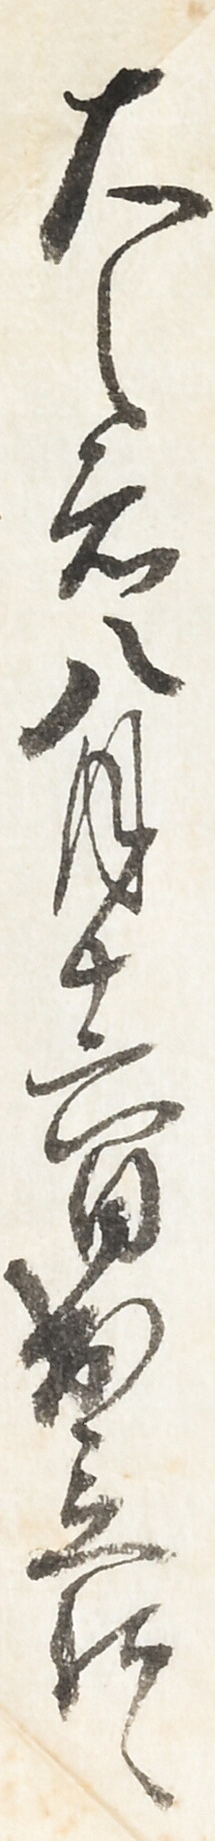右之者八月十六日出立仕候

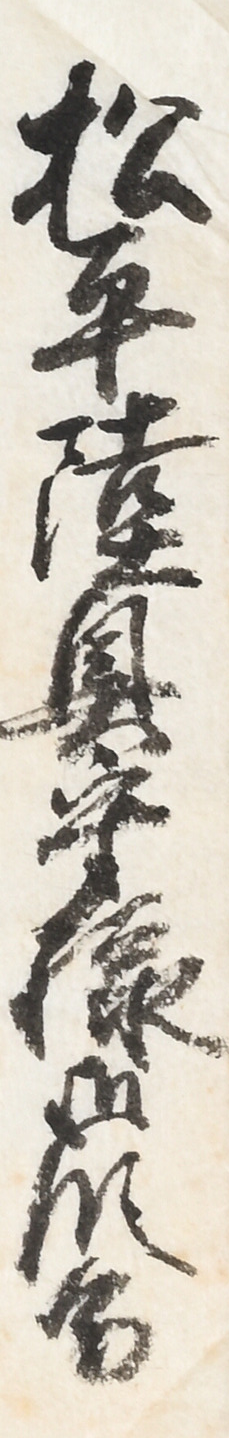松平陸奥守様御領分
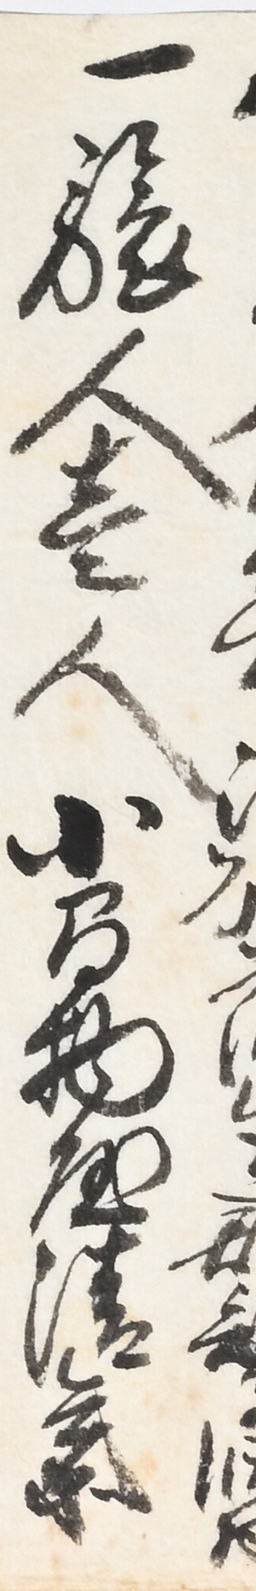一旅人壱人小間物屋清兵衛
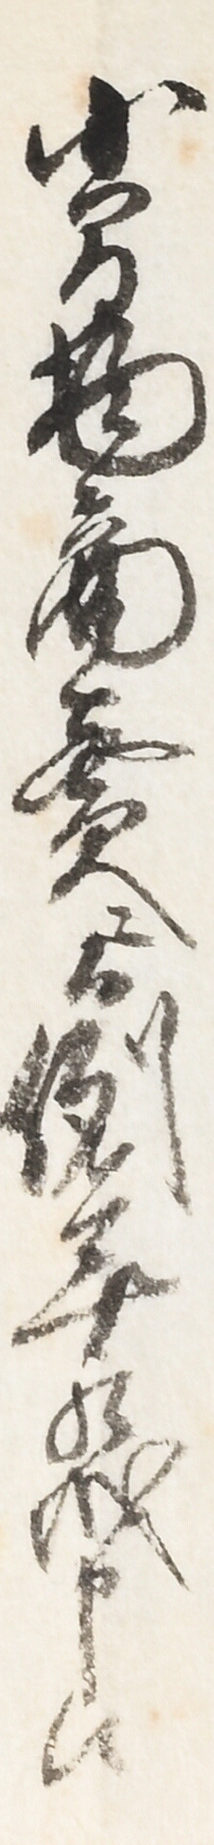小間物商売ニ而例年罷越申候
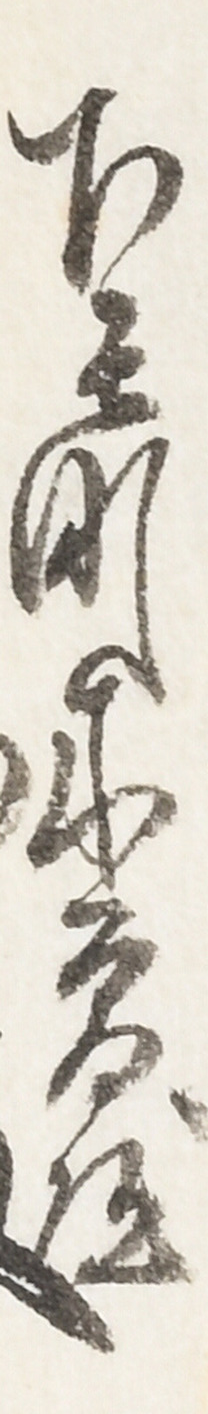下モ町木曽屋
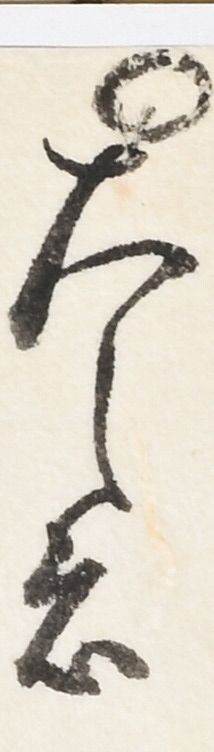〇右之者
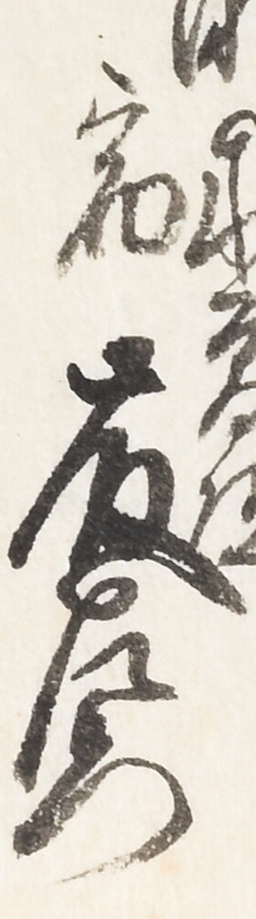宿籐左衛門
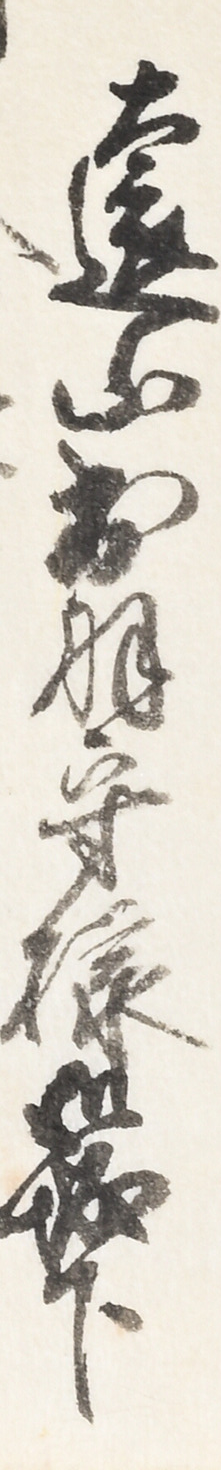遠山出羽守様御城下
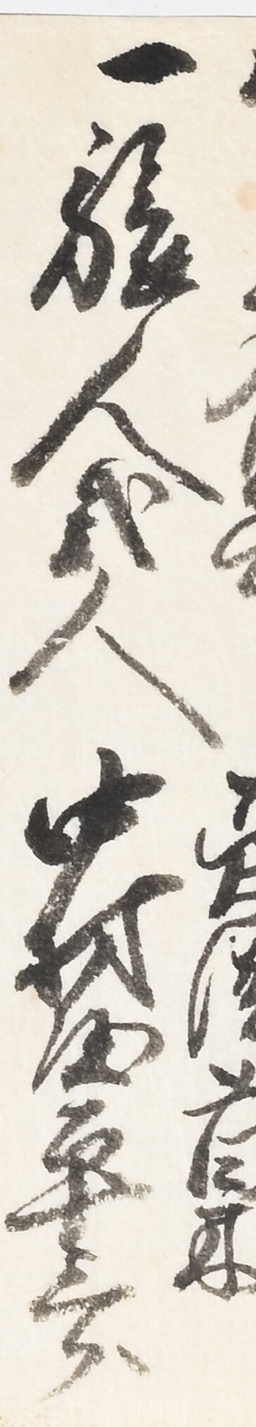一旅人弐人中村屋平三郎
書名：旅人泊控帳
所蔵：伊那市立高遠町図書館・合同会社AMANE
